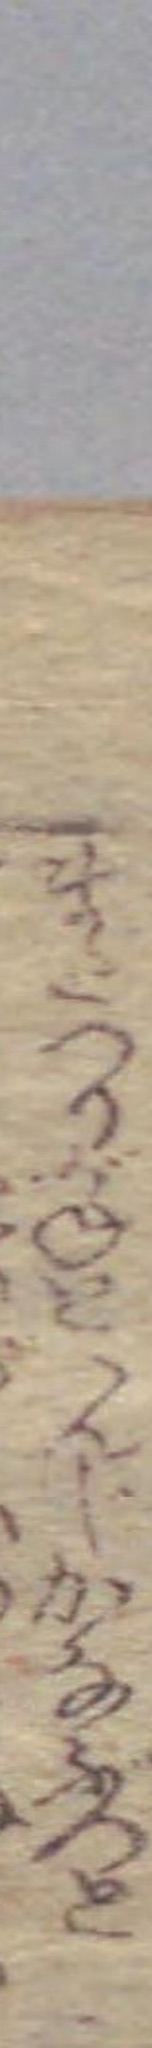またつりがねとへんじかなぶつと
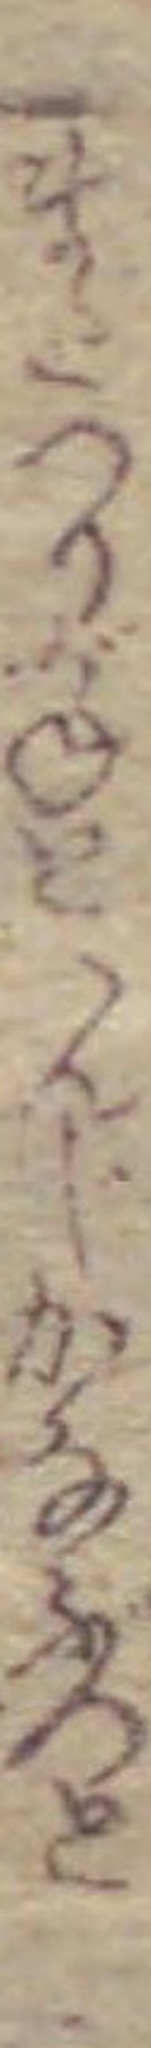またつりがねとへんじかなぶつと
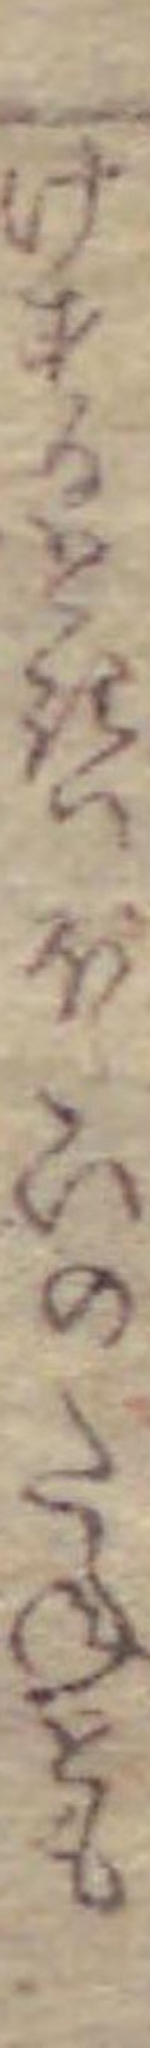けするときはぼだいのたねとも
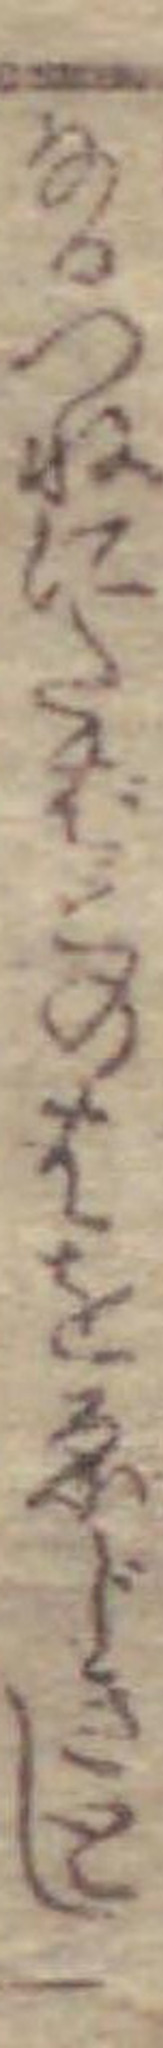なるつねにたばこのはをゑじきとし
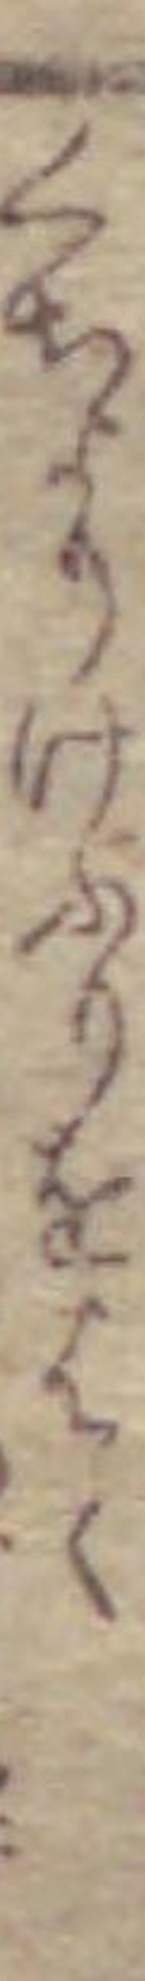くちよりけぶりをはく
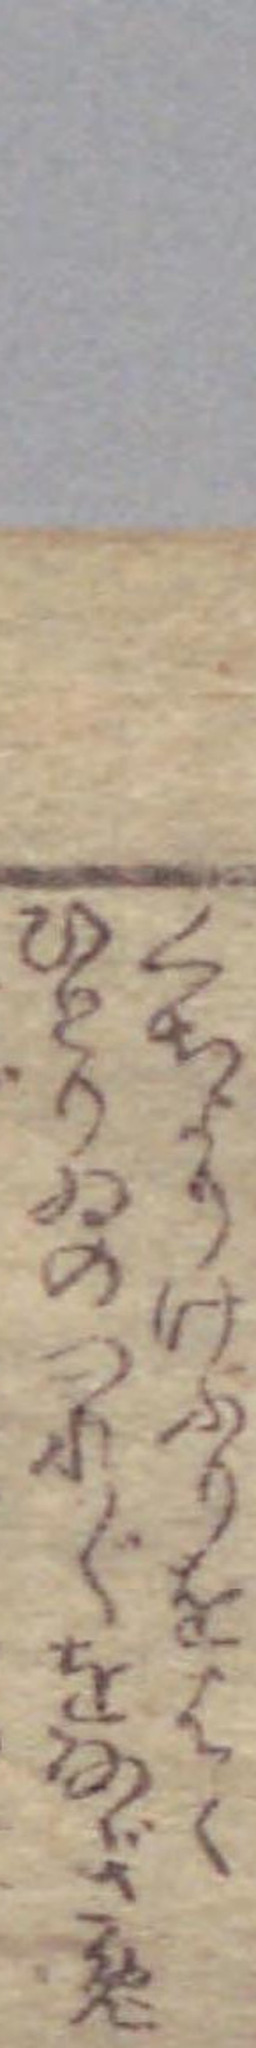ひとりゐのつれ〴〵をなぐさめ
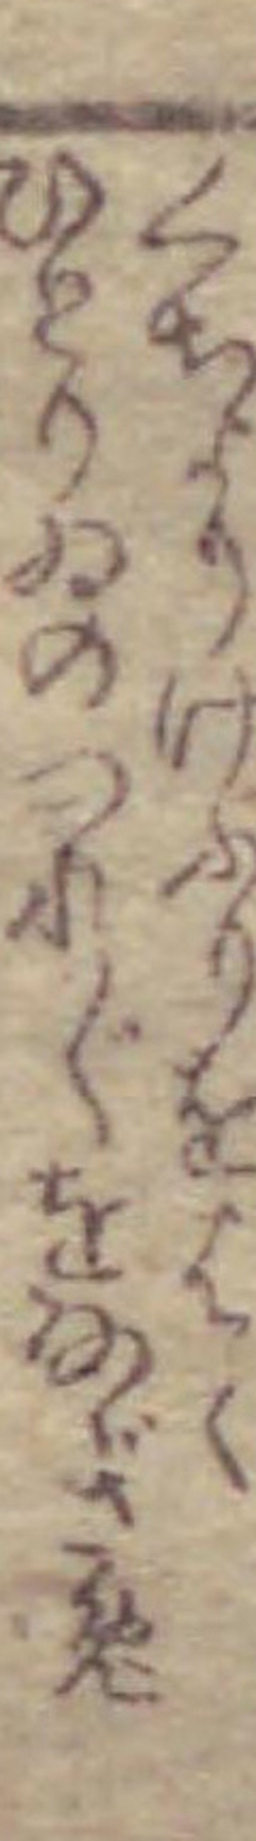ひとりゐのつれ〴〵をなぐさめ
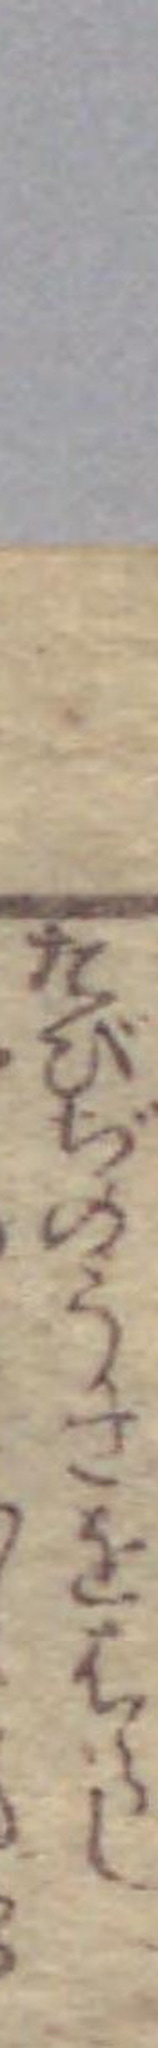たびぢのうさをはらし
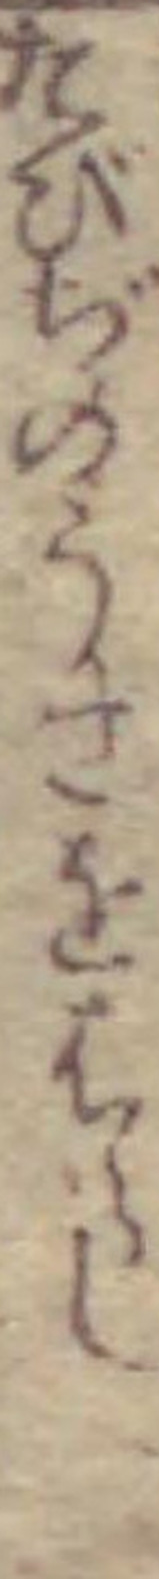たびぢのうさをはらし
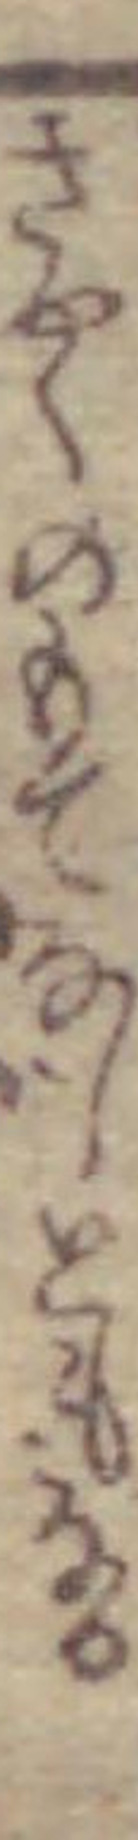きやくのもてなしともなる
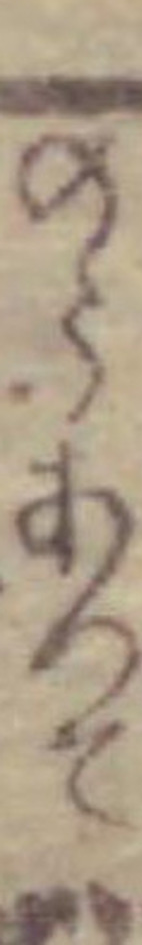のうあつて
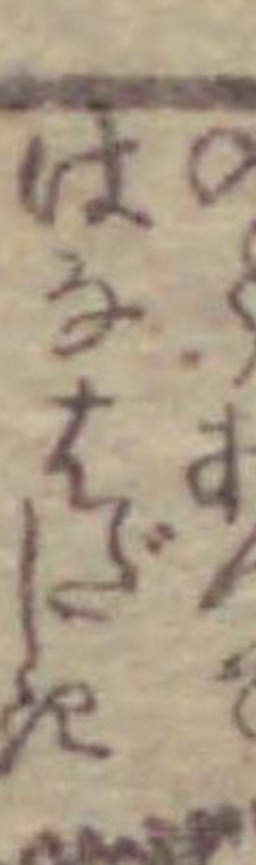はなはだしき
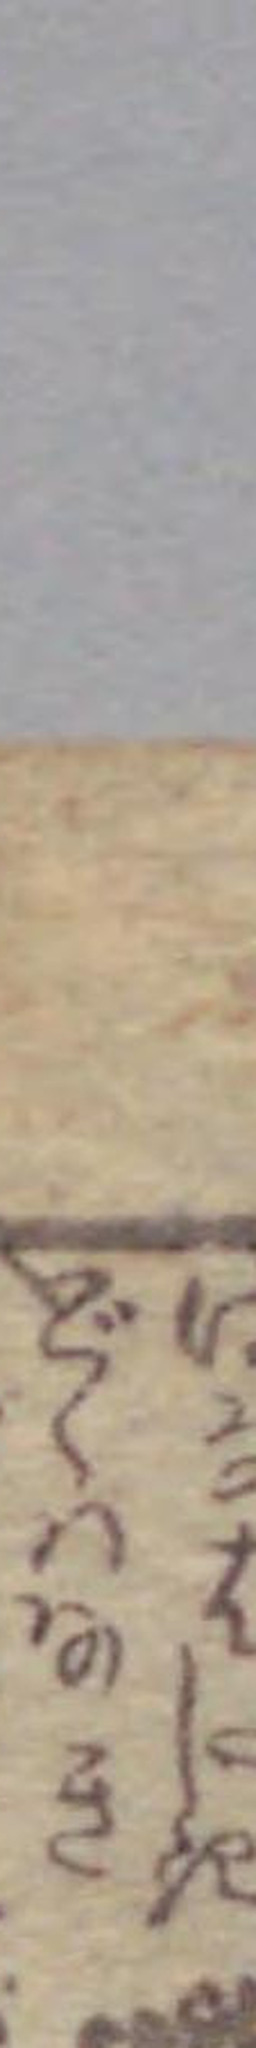どくはなき
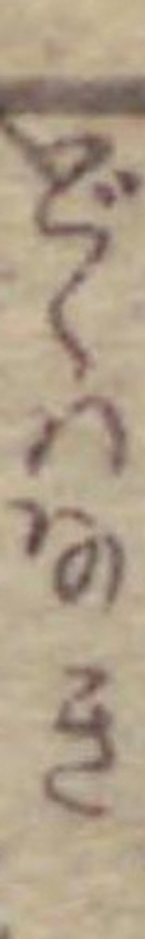どくはなき
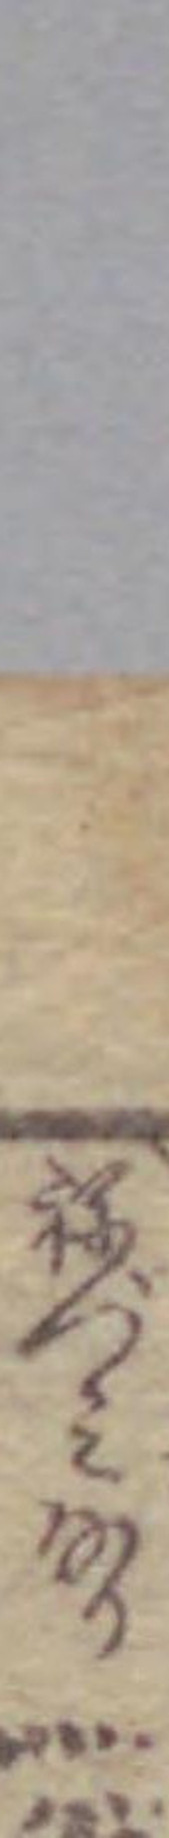ねづみなり
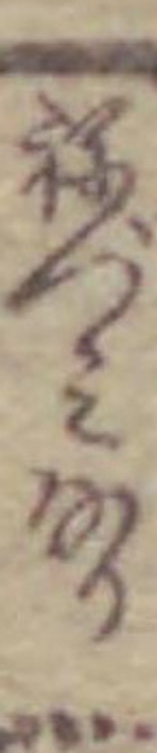ねづみなり
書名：化物和本草 : 3巻
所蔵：国立国会図書館 National Diet Library, JAPAN
